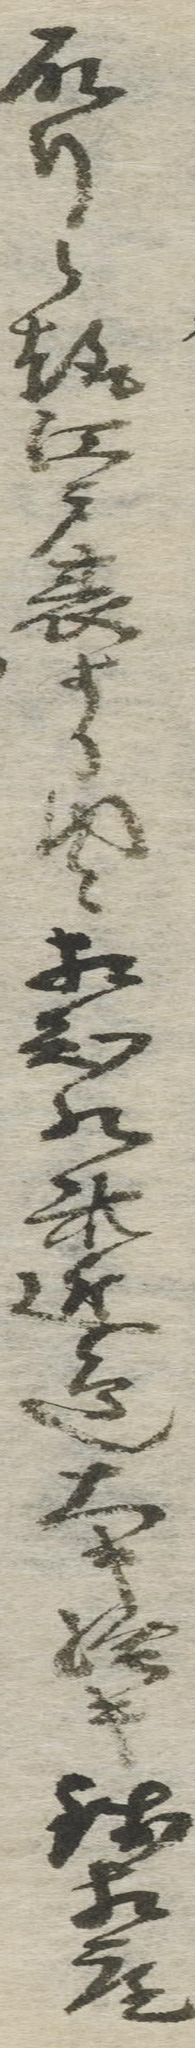取引候趣江戸表より内々相知れ此近辺大キ騒キ銭相座
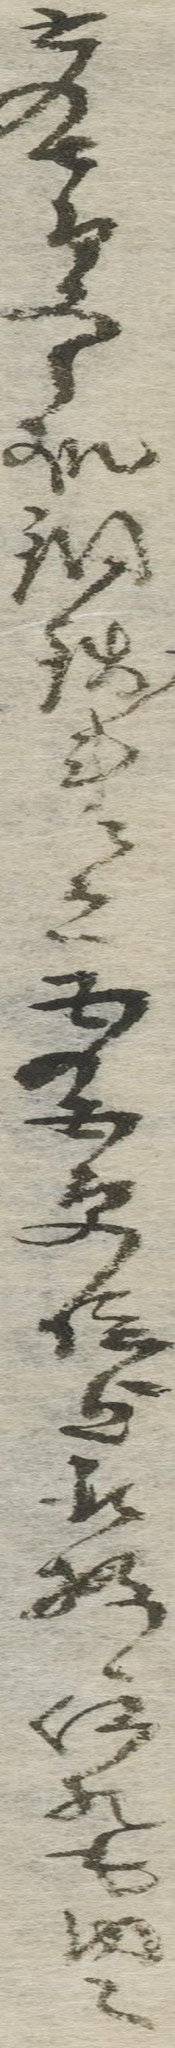六貫七百文之処銅銭計二而ハ五貫五百文位迄取扱候何れも内々
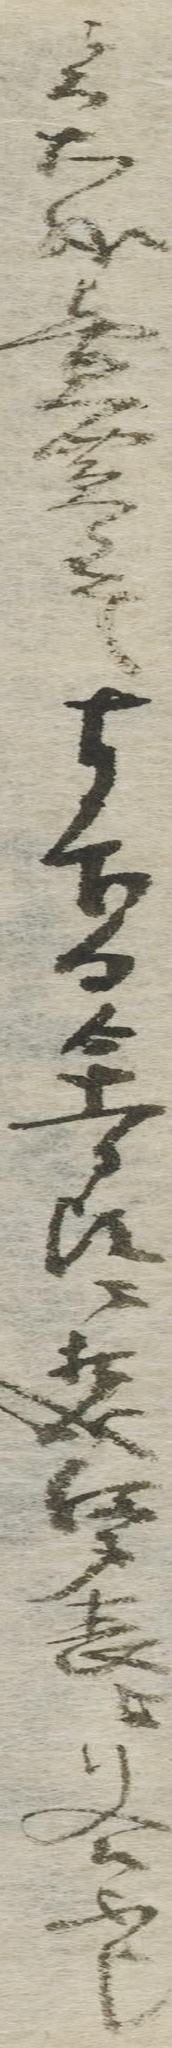二而右様売買いたし十月下旬ゟ十一月頃二相成江戸表江引合不申候
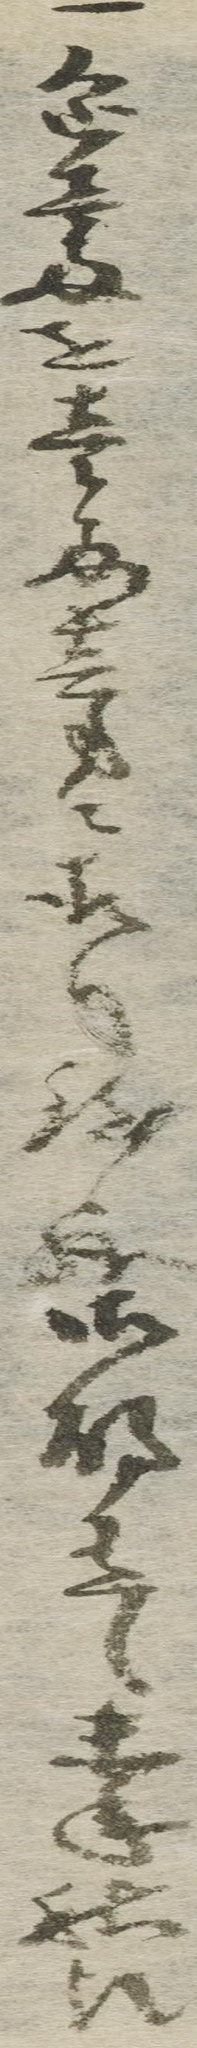一金壱両を壱両十二月二取引致様御触有之未年秋頃
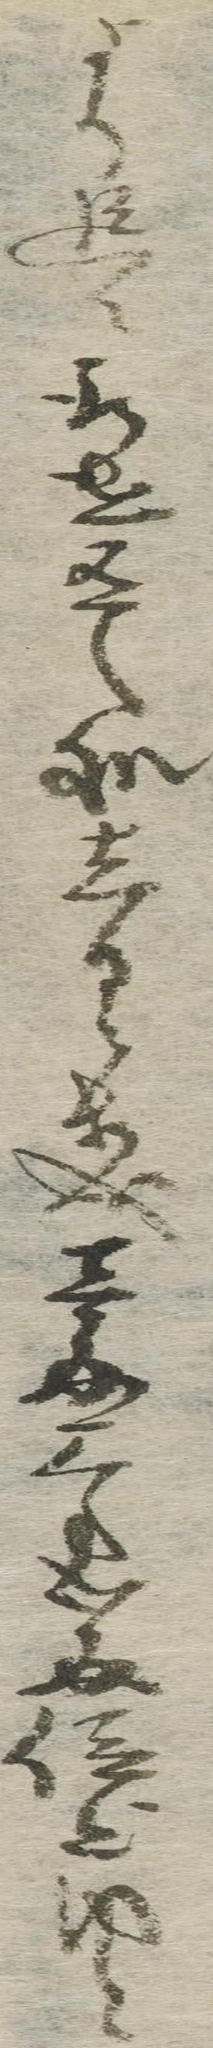より追々取遣有之所十二月二相成壱両三分弐両位迄内々

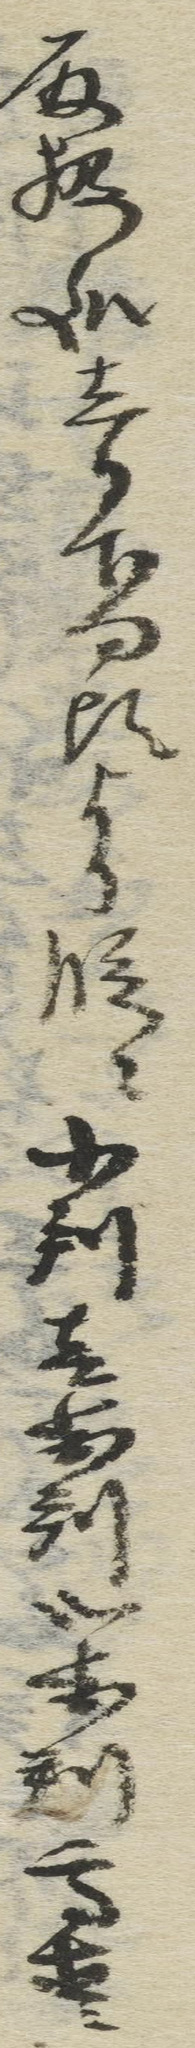取扱候様十二月下旬頃より段々小判壱歩判弐歩判高直二
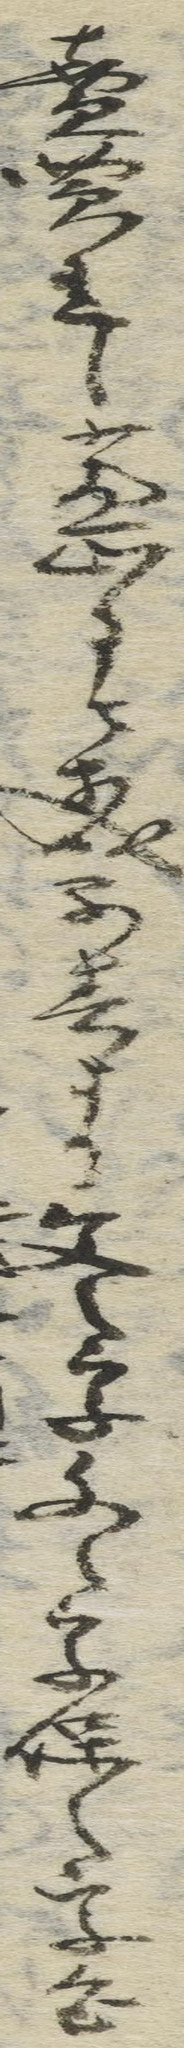売買有之当正月二相成早春より文之字文之字保之字以上
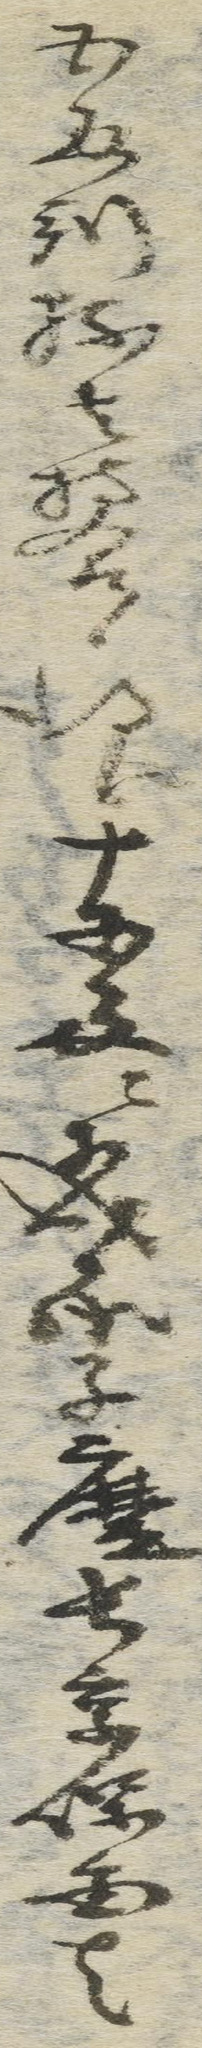五両判抔は持合候得ハ十五両二相成候様子慶長享保金は
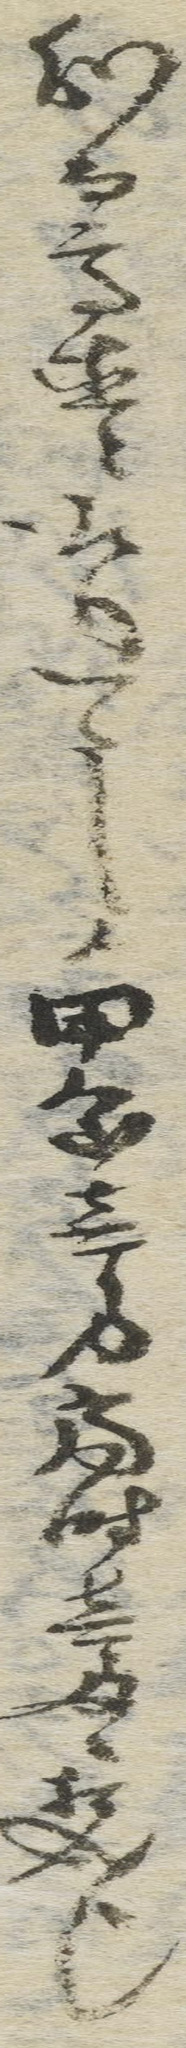至而高直二取引いたし候甲金壱分当時壱両二相成申候
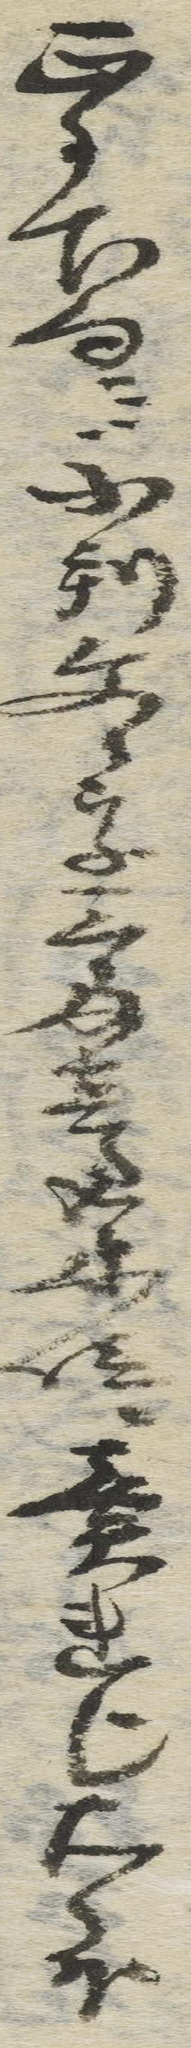正月下旬二ハ小判文之字三両壱分弐朱位二売れ申候右之外
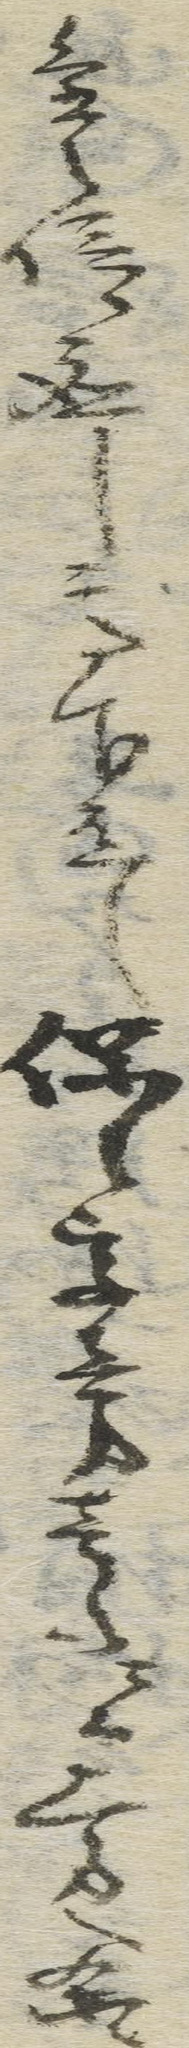金之位二応し高下有之保之字壱両壱分二而三両之余
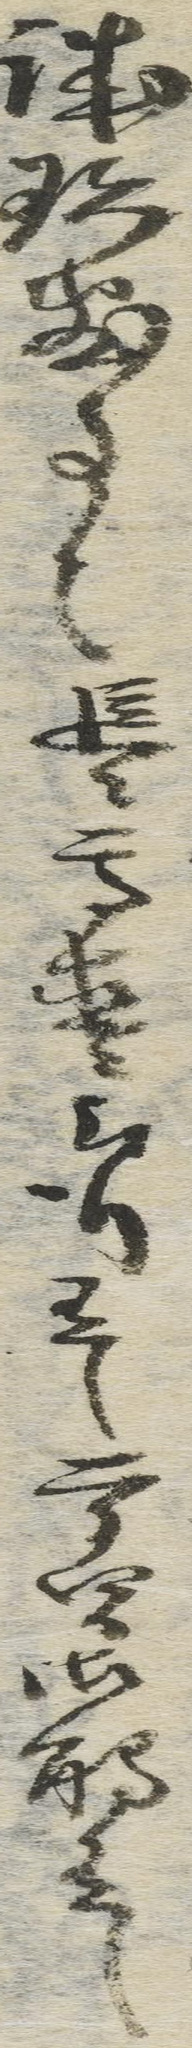誠珍敷事候追々高直二取引有之二月四日御触有之
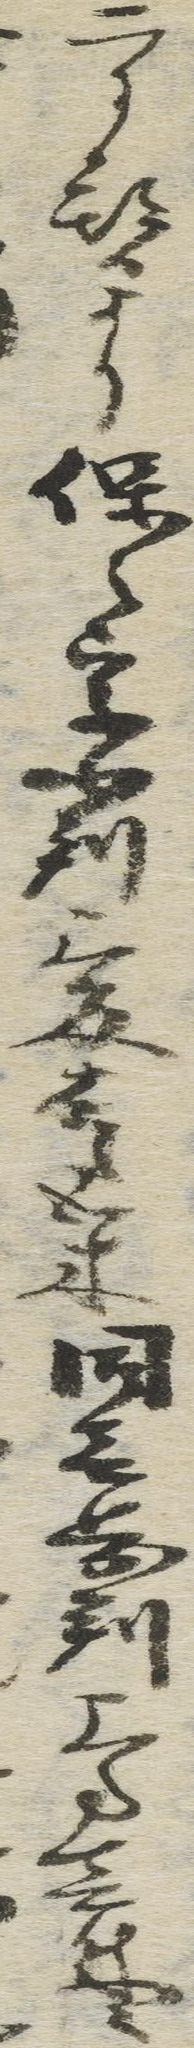二月朔日より保之字小判三両壱分弐朱同壱歩判三分壱朱二
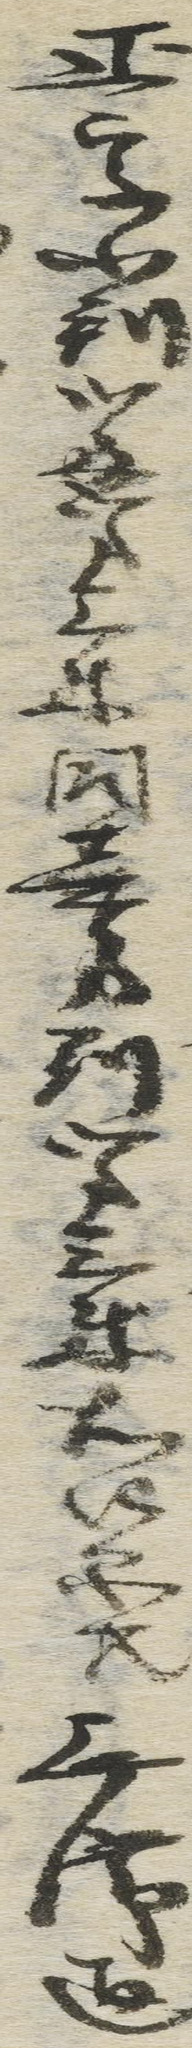正字小判弐両弐分三朱同壱分判弐分三朱右四品共無滞通
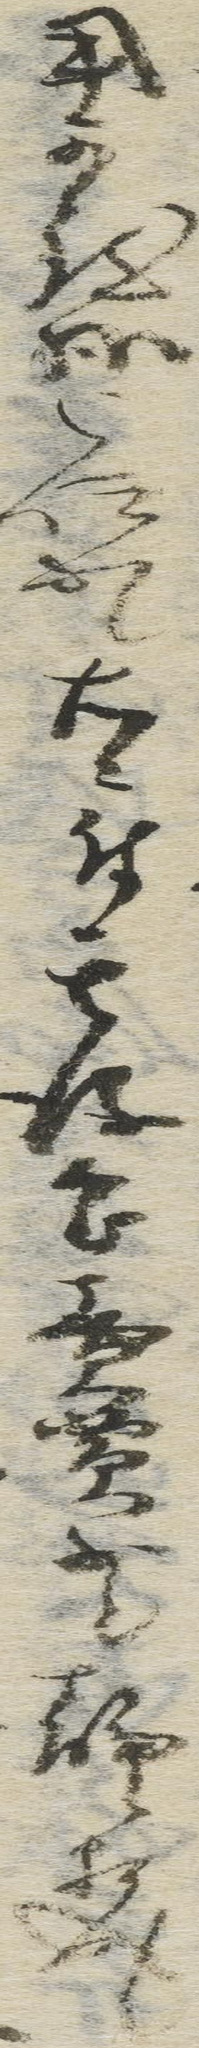用可致様被仰出候右二付其後金売買少し静二相成候
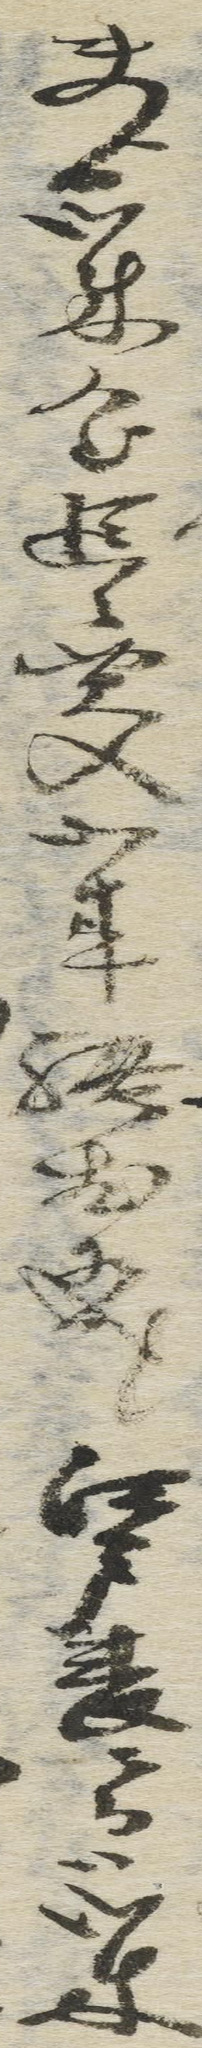夫ゟ弐朱金追々買入以来騒敷相成候江戸表二而ハ弐朱
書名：信濃越後　地震書留
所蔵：東京大学地震研究所図書室 Earthquake Research Institute Library, The University of Tokyo, JAPAN
